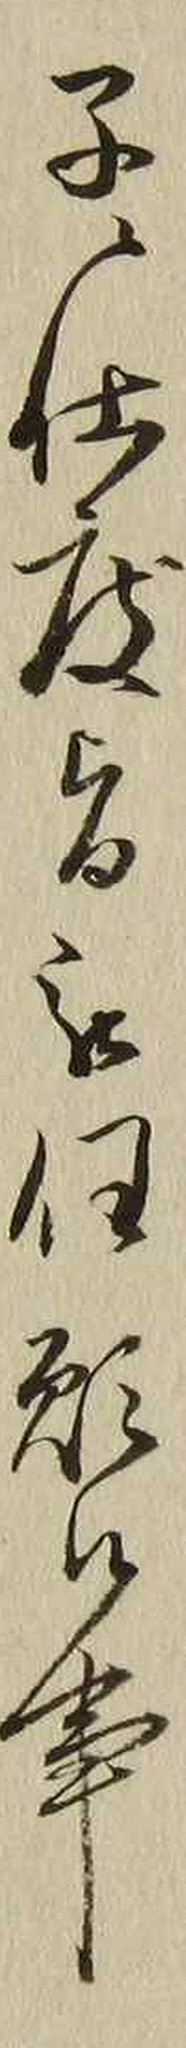子ニ仕度旨被任願候事
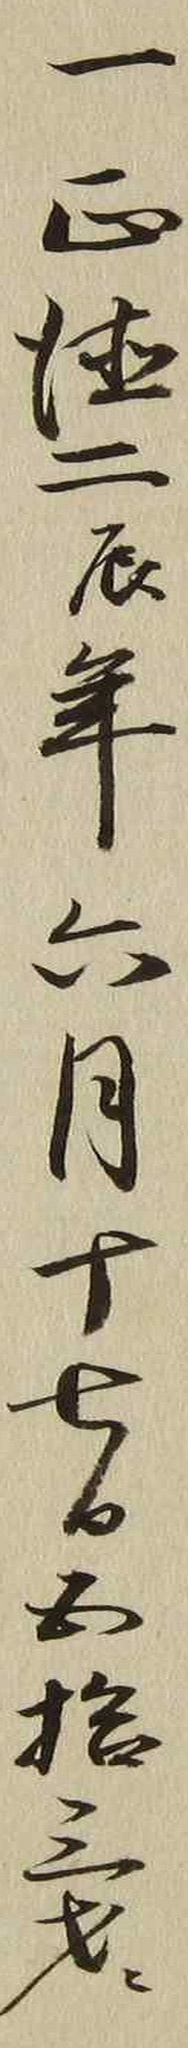一正徳二辰年六月十七日五拾三才ニ
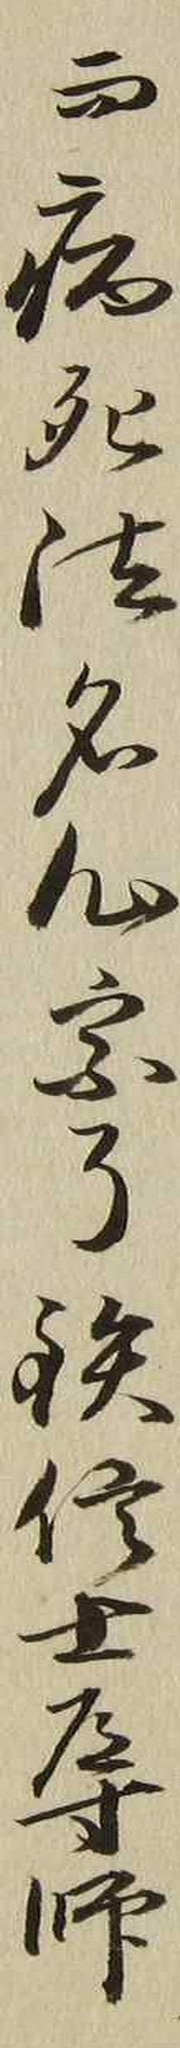而病死法名心宗了鉄信士導師

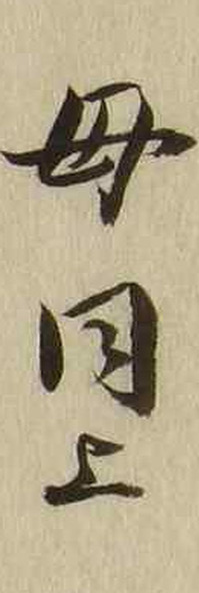母同上
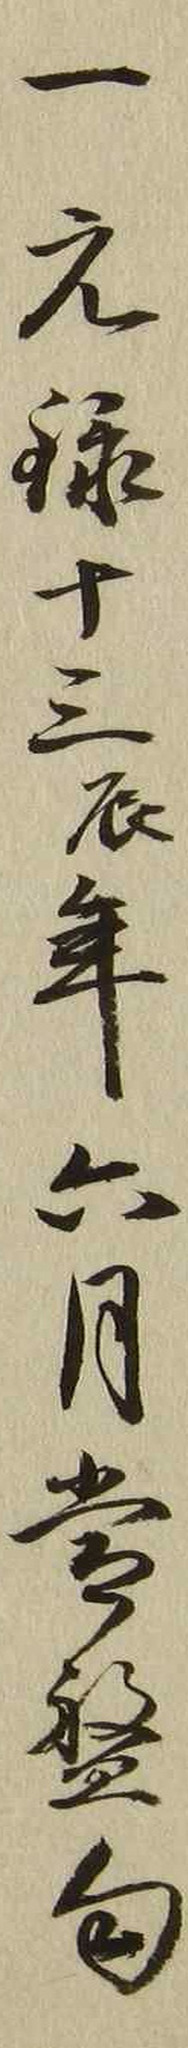一元禄十三辰年六月常盤勾
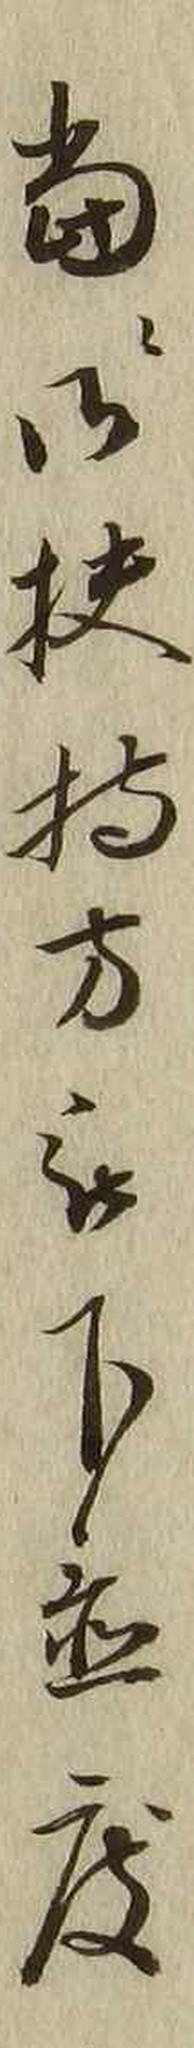当ニ御扶持方被下置度
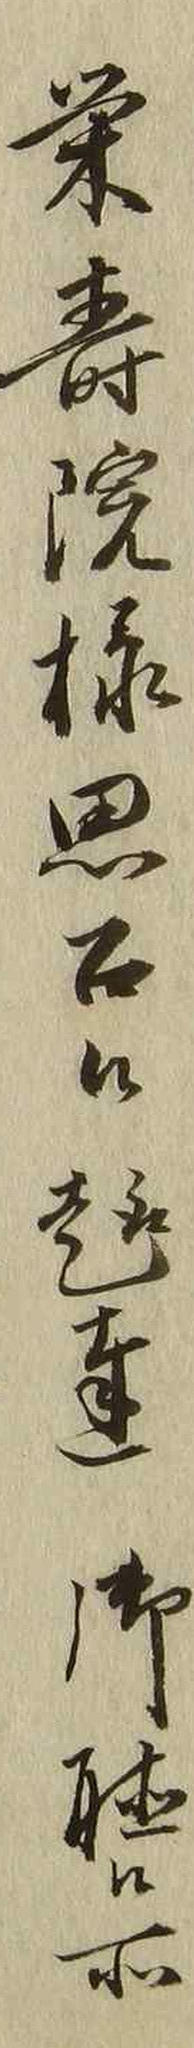栄寿院様思召候趣達御聴候所
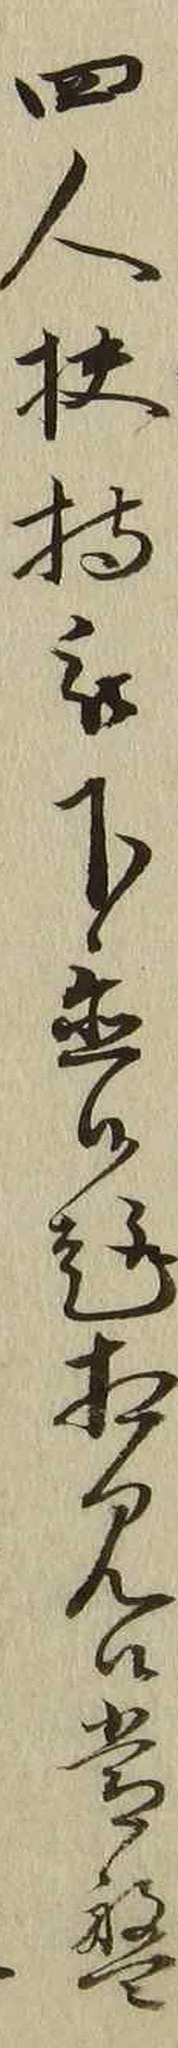四人扶持被下置候趣相見候常盤
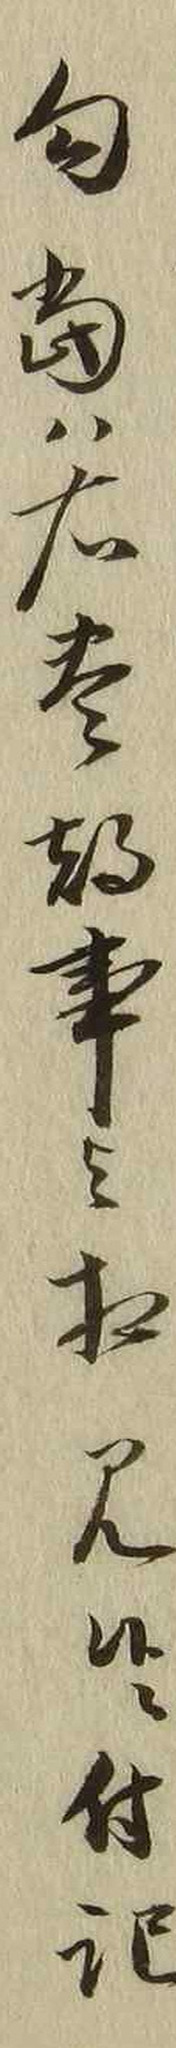勾当ハ右豊都事与相見候ニ付記
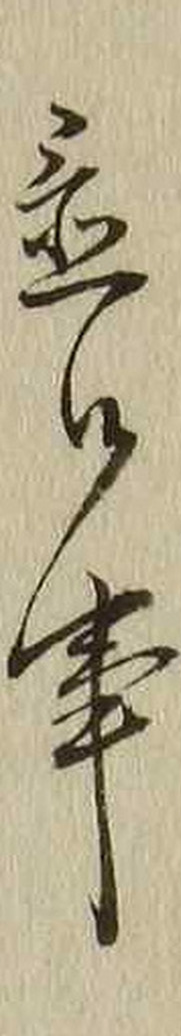置候事
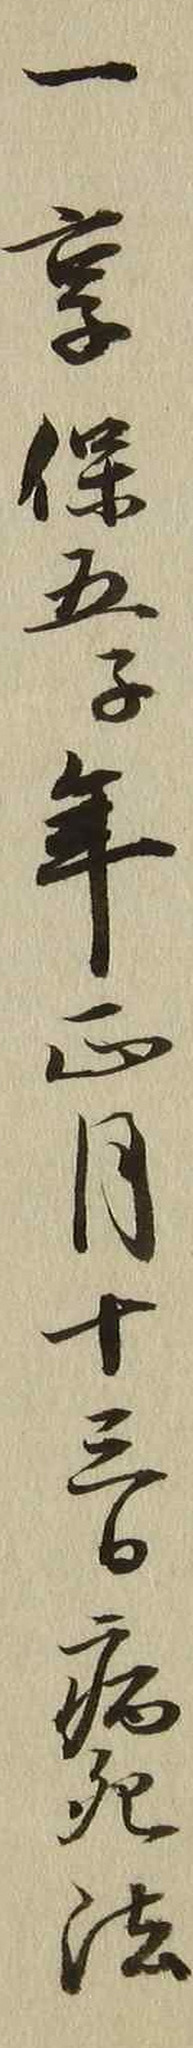一享保五子年正月十三日病死法
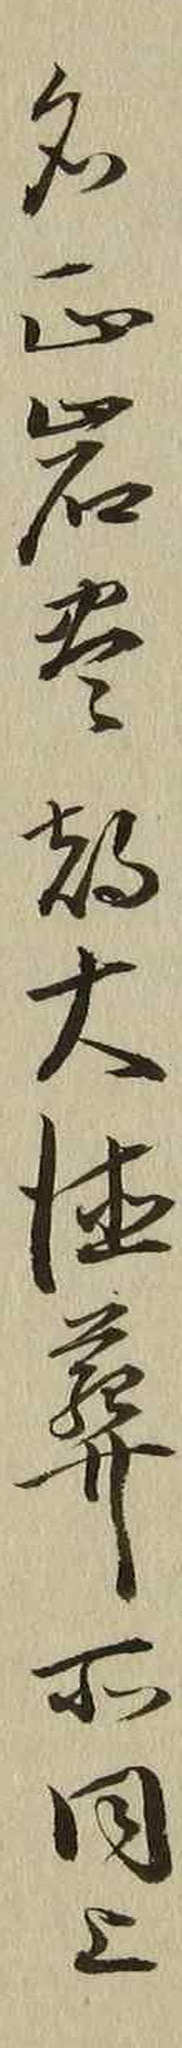名正岩豊都大徳葬所同上
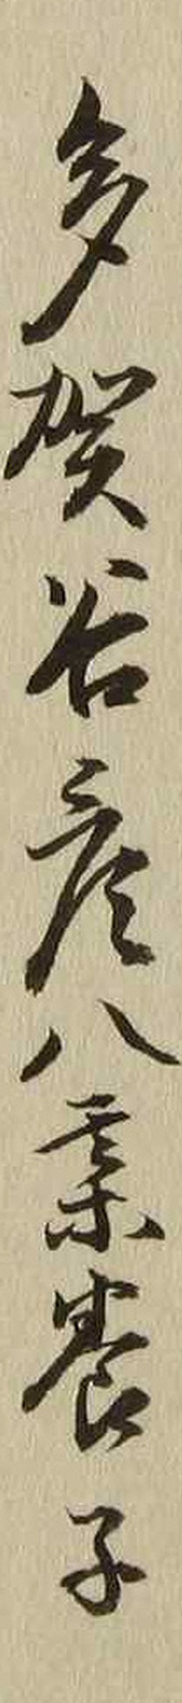多賀谷彦八某養子
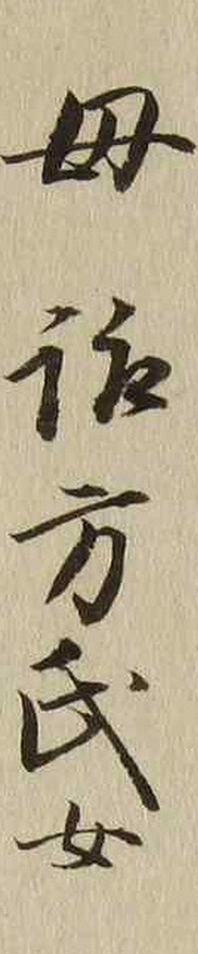母諏方氏女
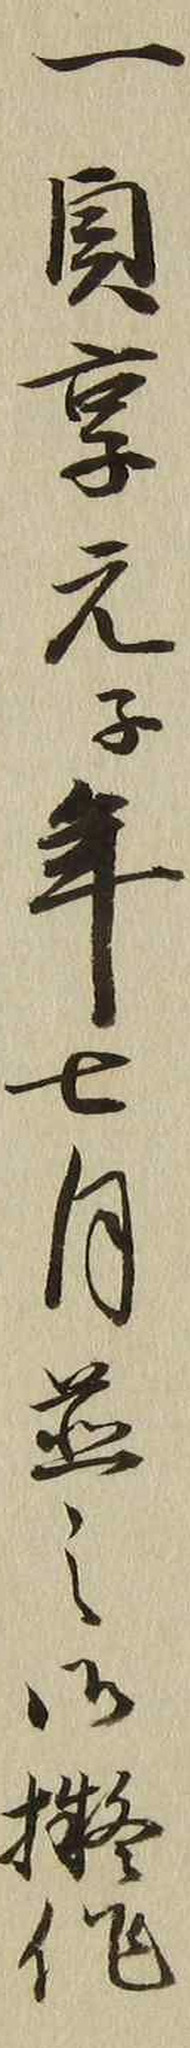一貞享元子年七月並之御擬作
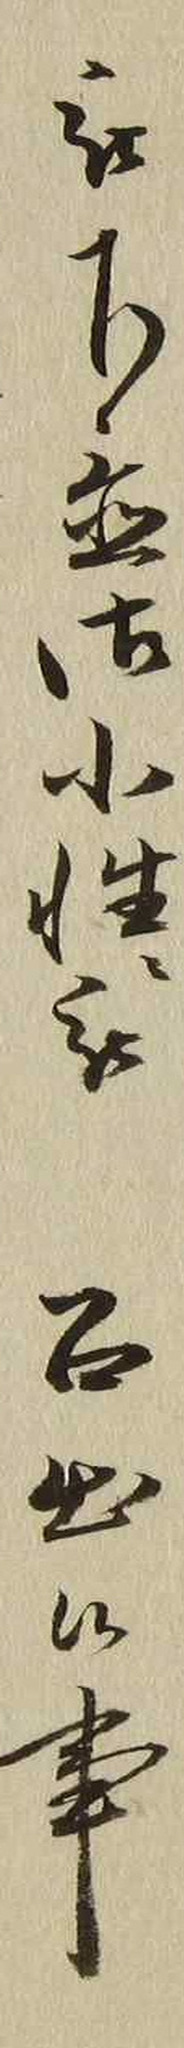被下置御小性ニ被召出候事
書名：諸士系譜　巻之61　と之部4
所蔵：会津若松市立会津図書館
